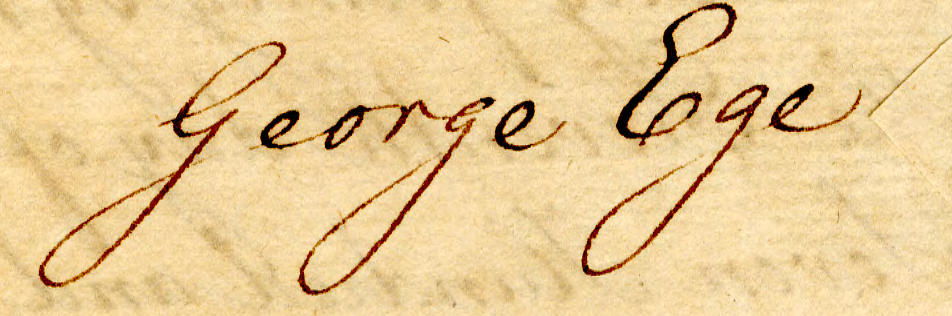George Ege
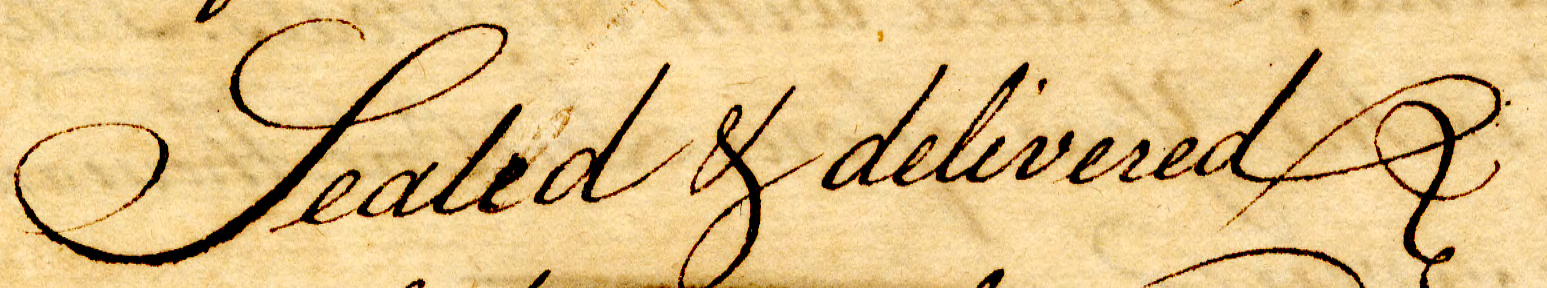Sealed & delivered
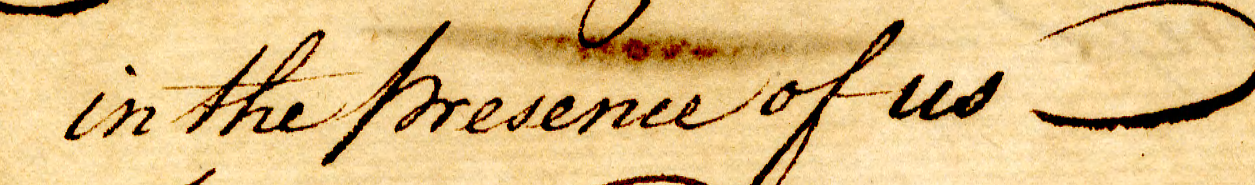In the presence of us
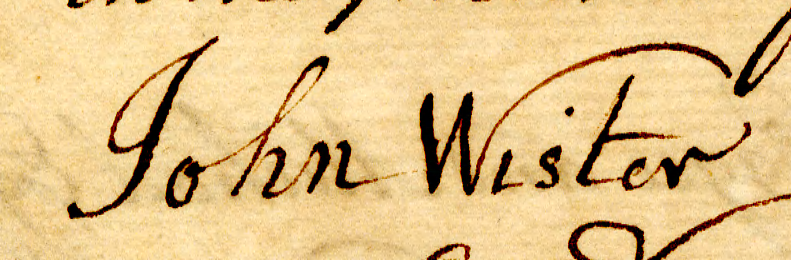John Wister
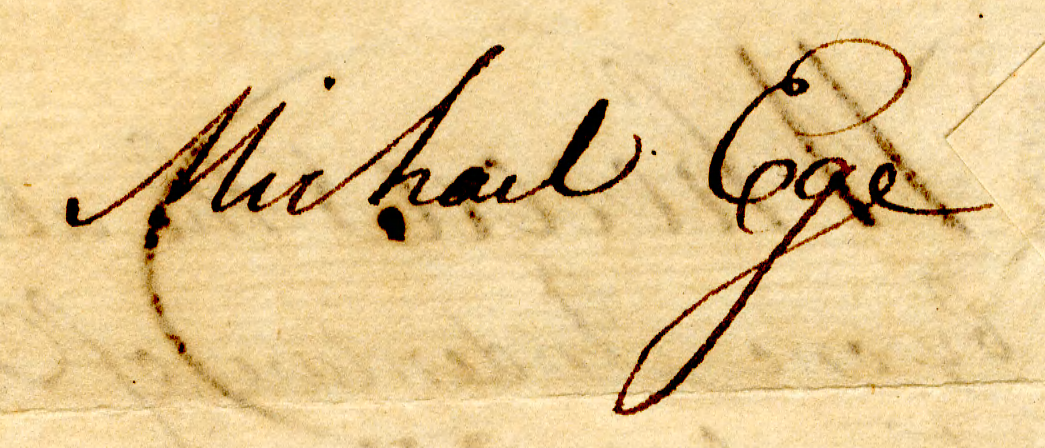Michael Ege
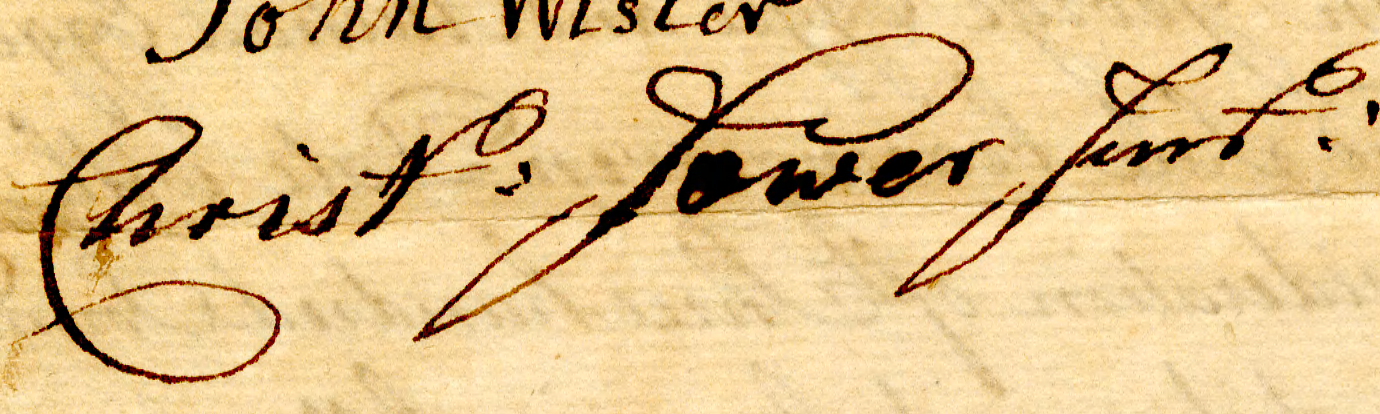Christ^r. Sower Jun^r.
